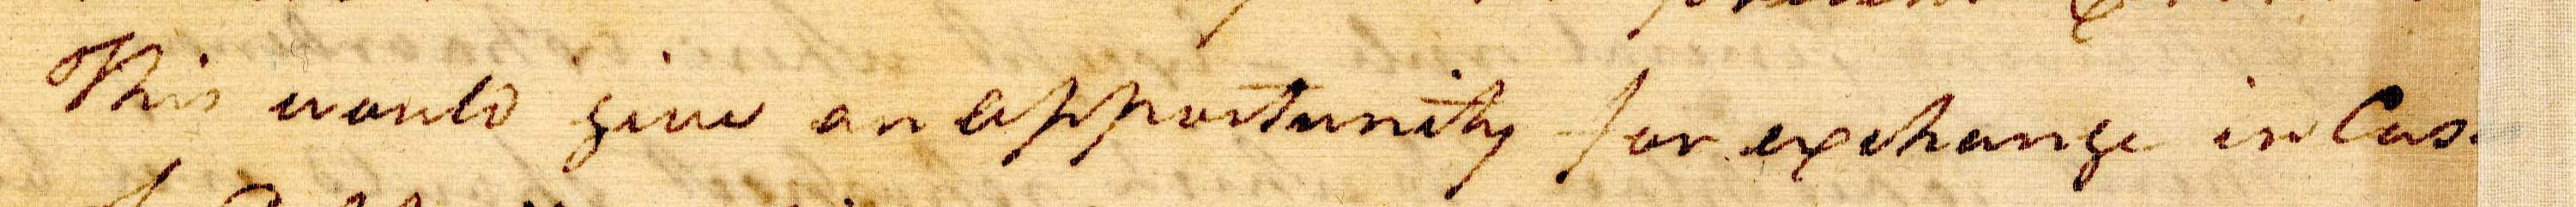This would give an opportunity for exchange in case
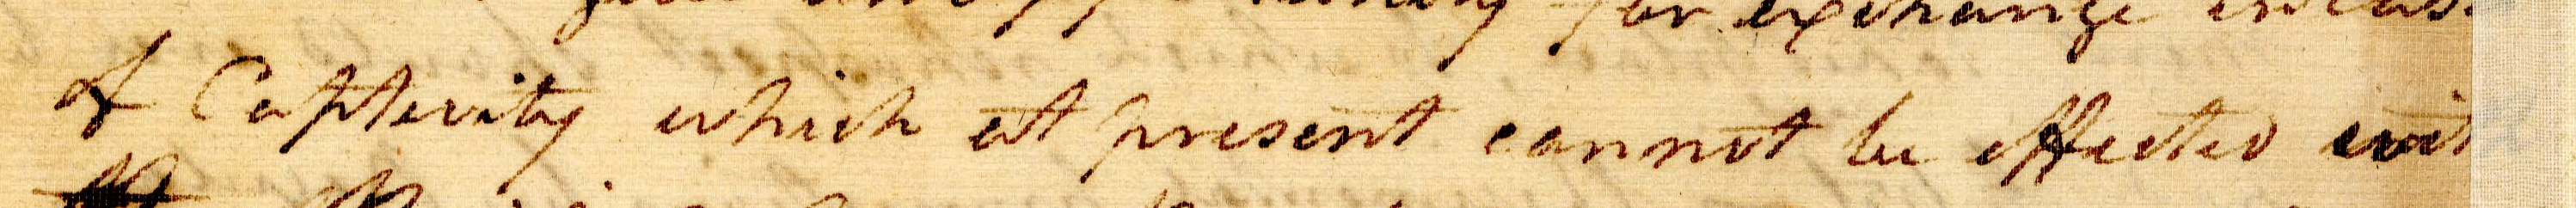of Captivity which at present cannot be effected with
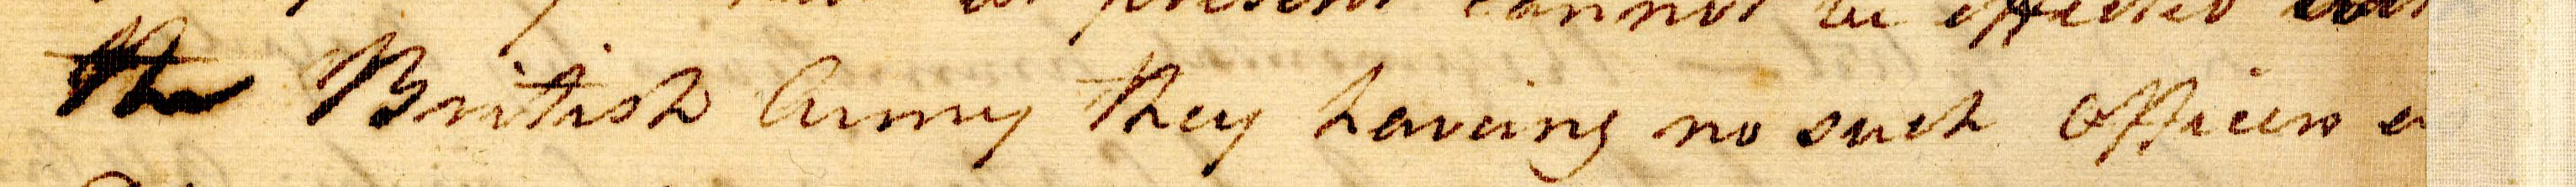the British Army they having no such Officers as
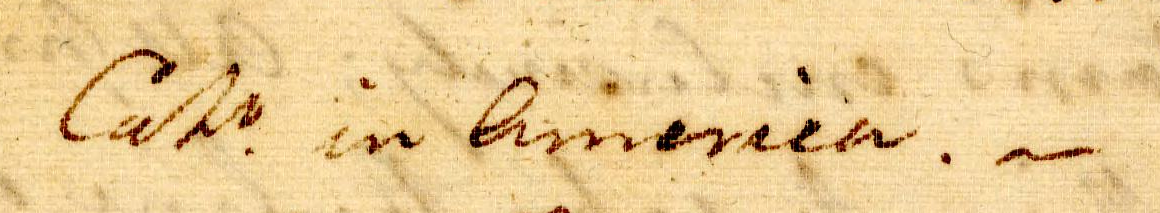Col^o. in America.-
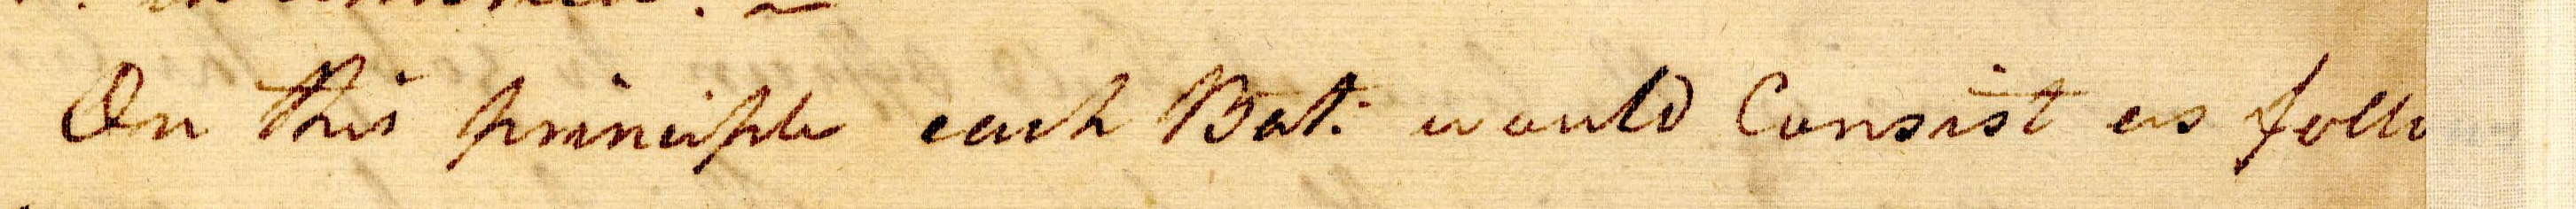On this principle each Bat: would Consist as follows
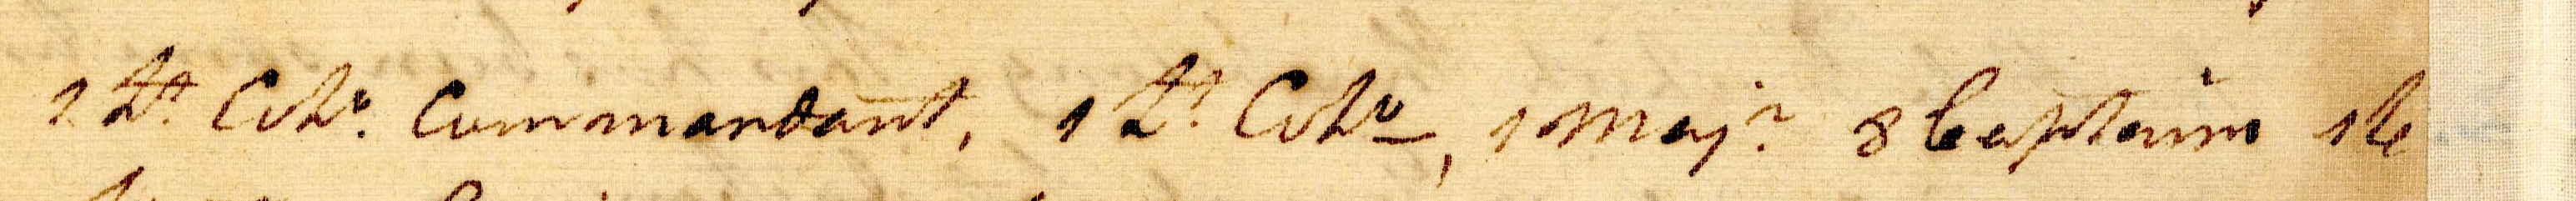1 L^t. Col^o. Commandant, 1 L^t. Col^o, 1 maj^r. 8 Captains 16
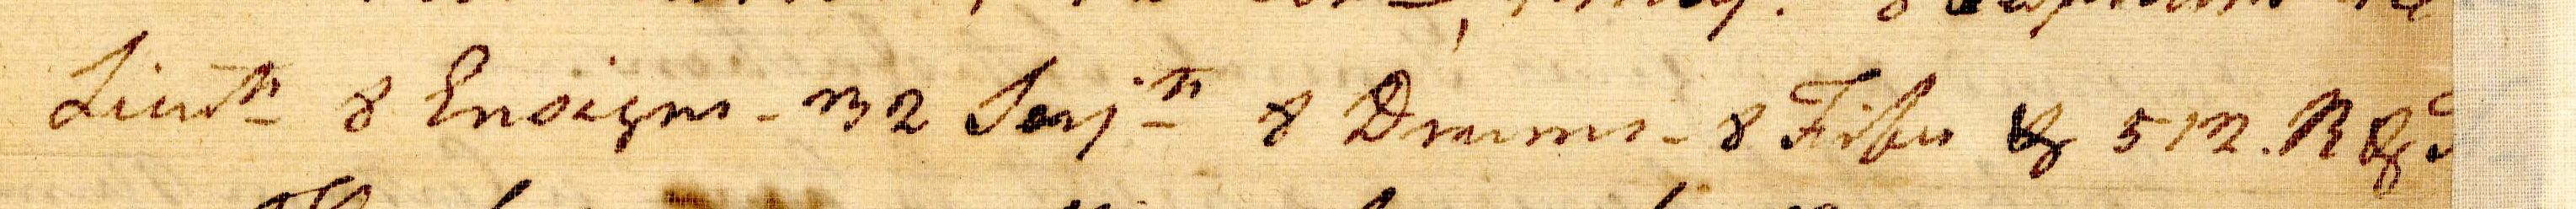Lieut^s 8 Ensigns- 32 Serj^ts 8 Drums- 8 Fifes & 512 R & F.
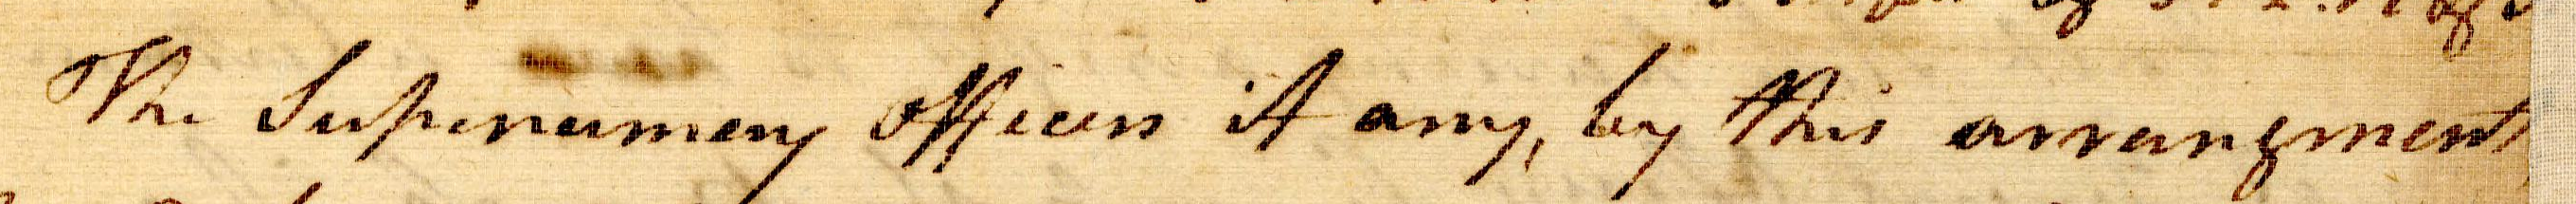The Supenumery Officers if any, by this arrangment
